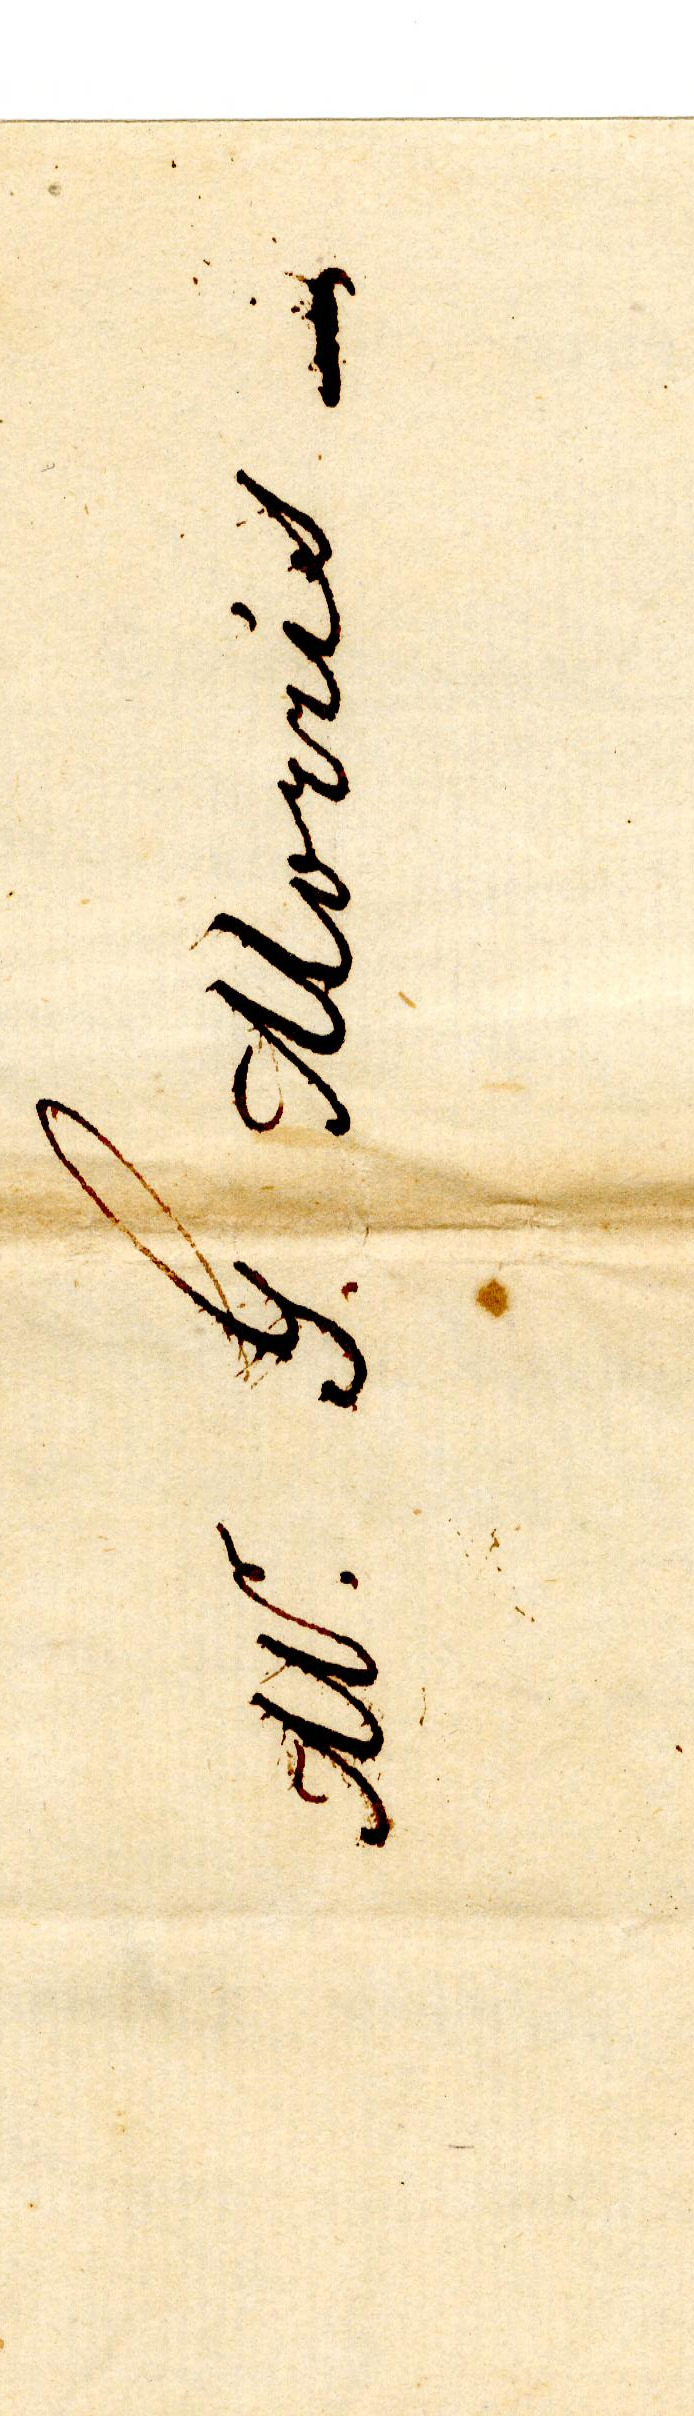M^r. G. Morris-
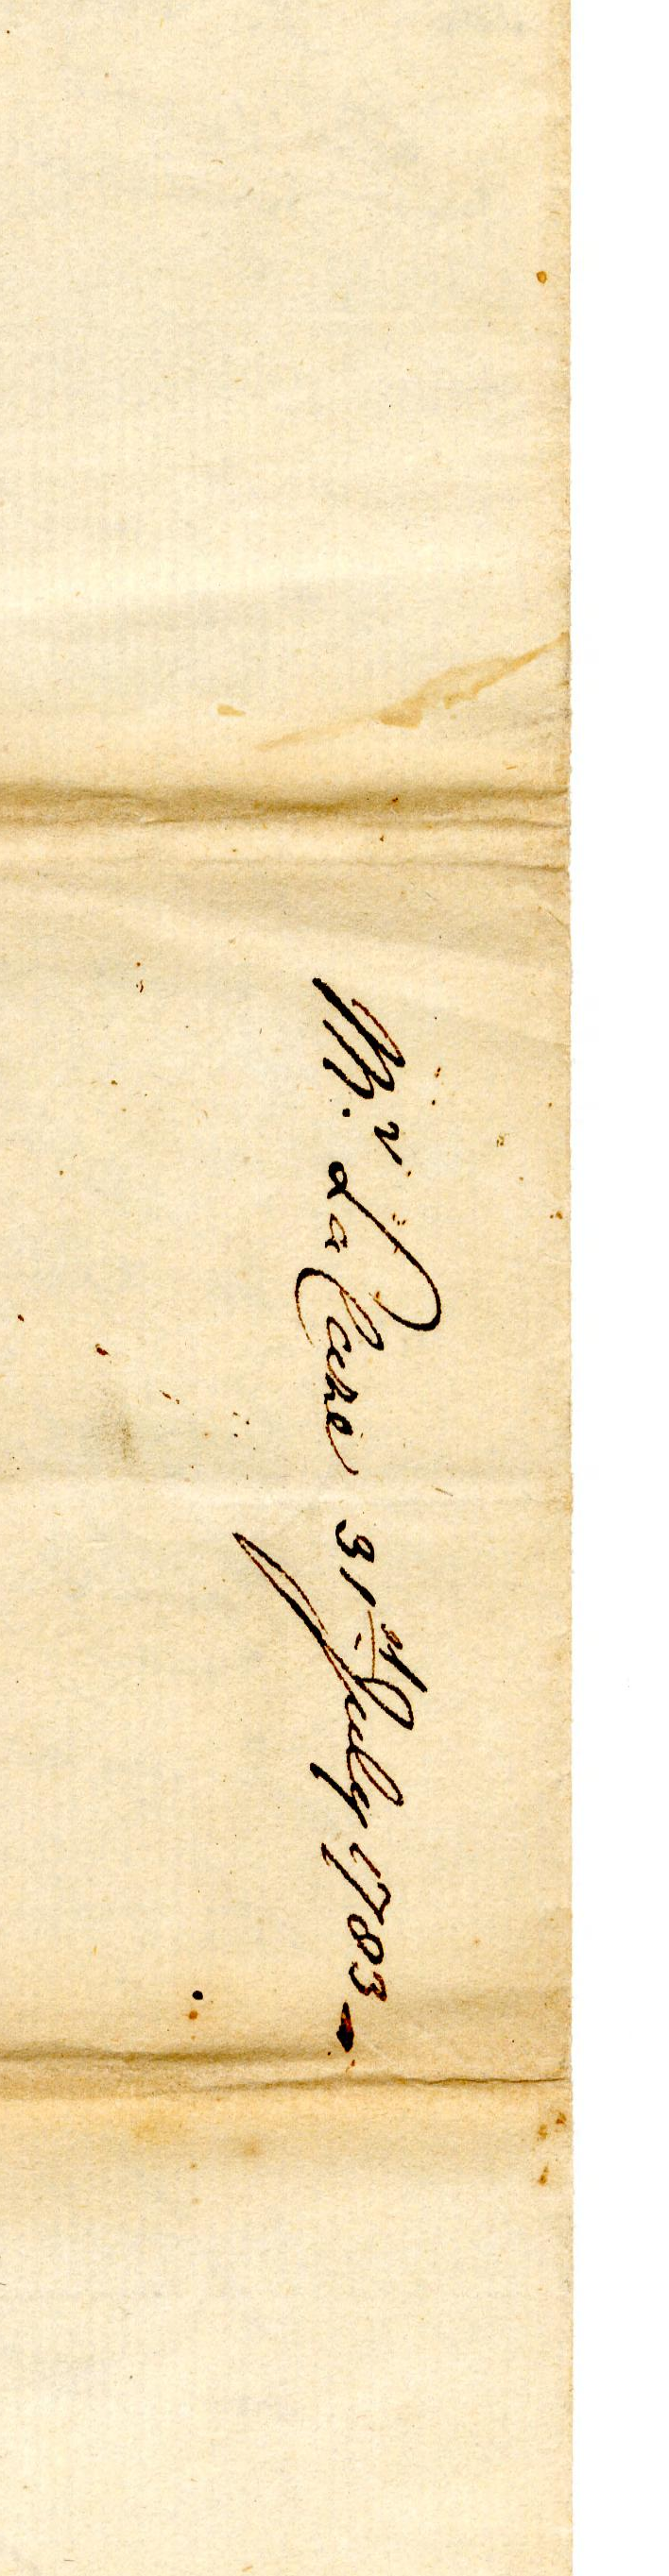M^r. LaCaze 31^st. July 1783-
